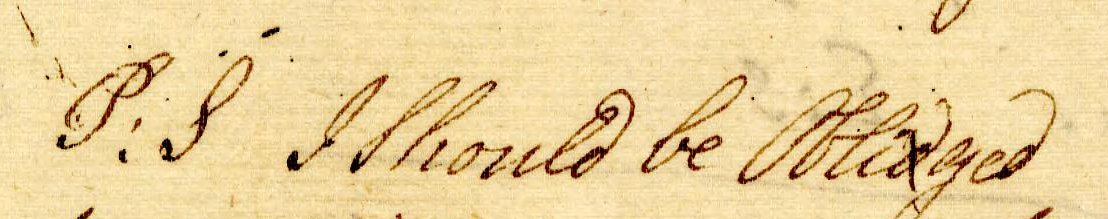P:S I Should be Obli[d]ged
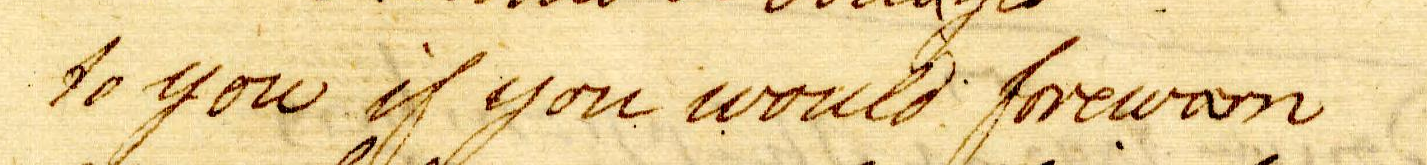to you if you would forewarn
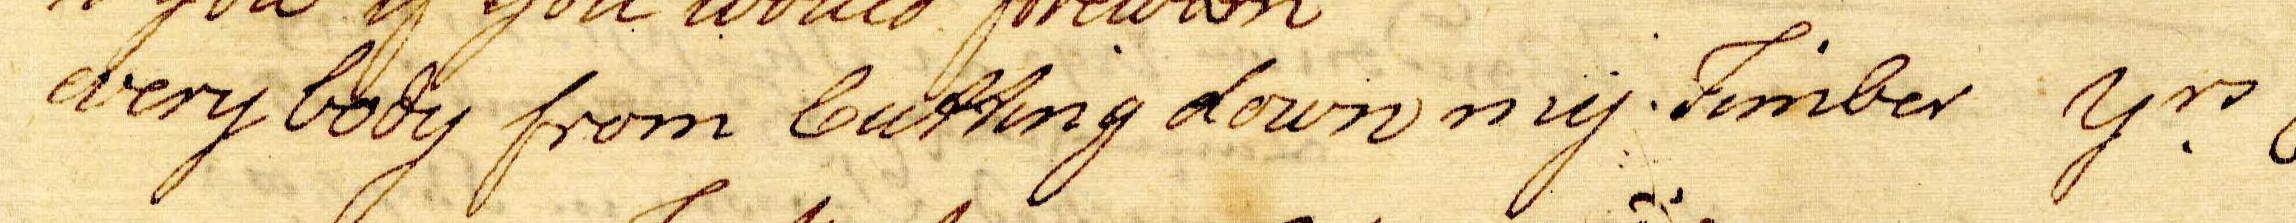every body from Cutting down my Timber y^rs.
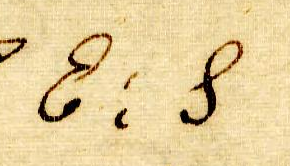E:S
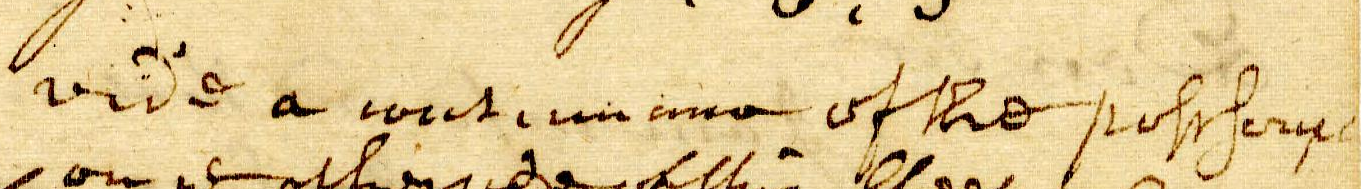vide a coutrunmme of the poss servt
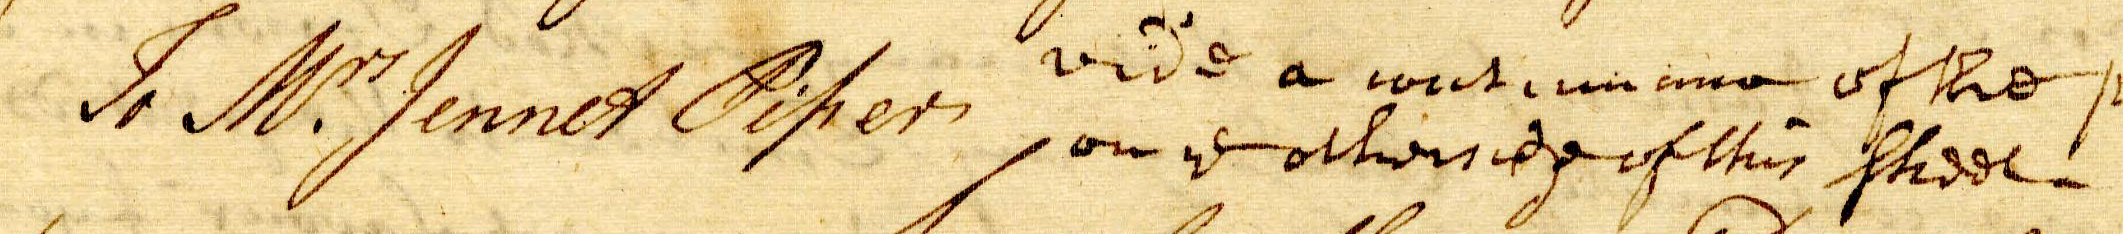Io M^rs. Jennet Peper , on y^e other side of this shool
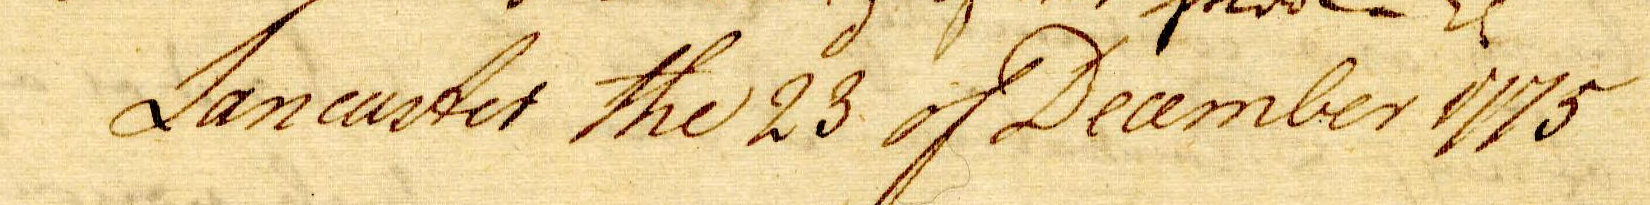Lancaster the 23 of December 1775
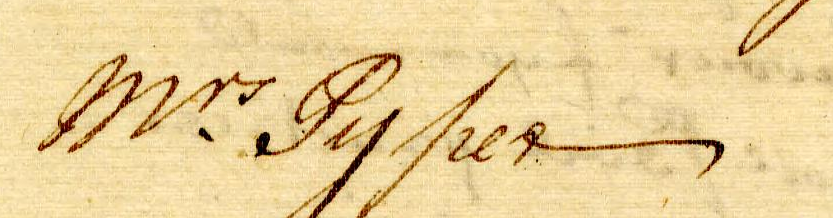M^rs. Pyper
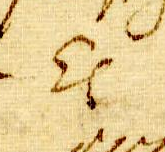ES
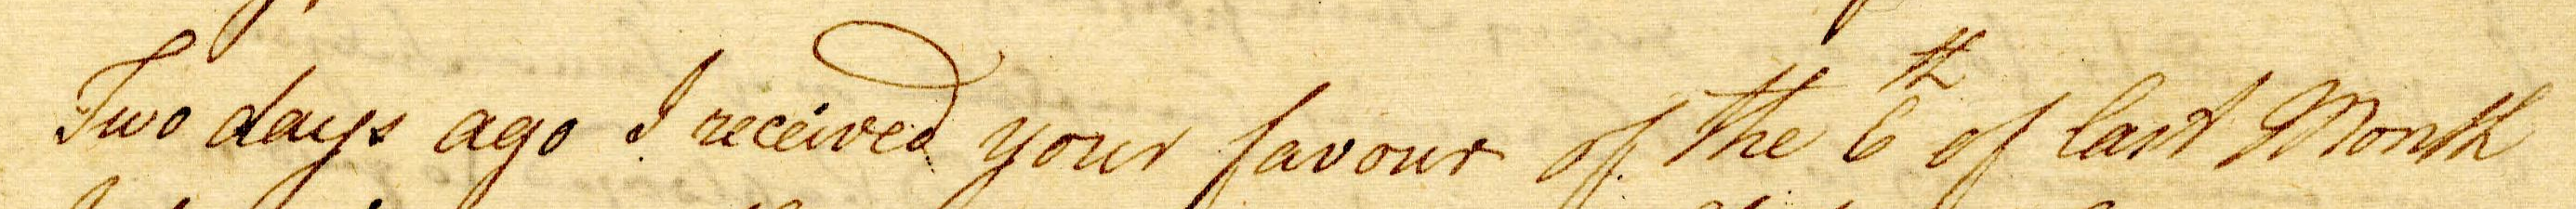Two days ago I received your favour of the 6^th of last Month
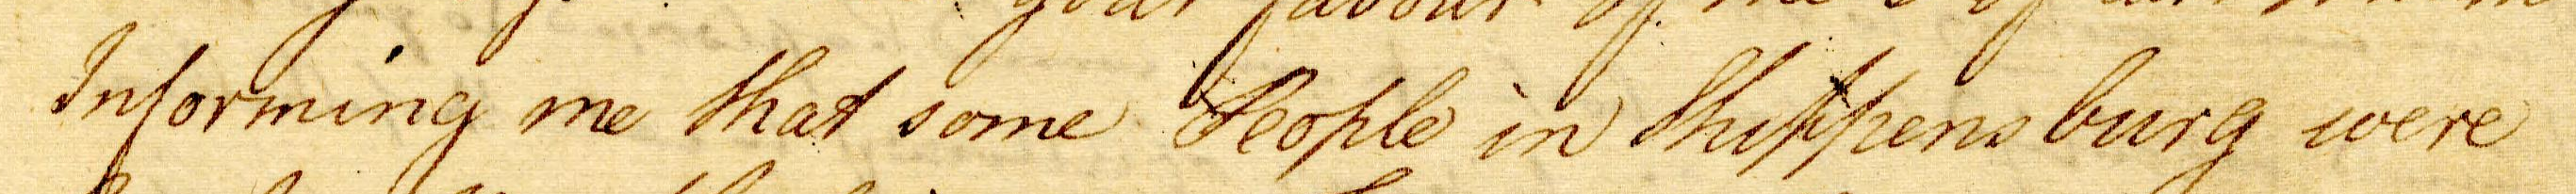Informing me that some People in Shippens burg were
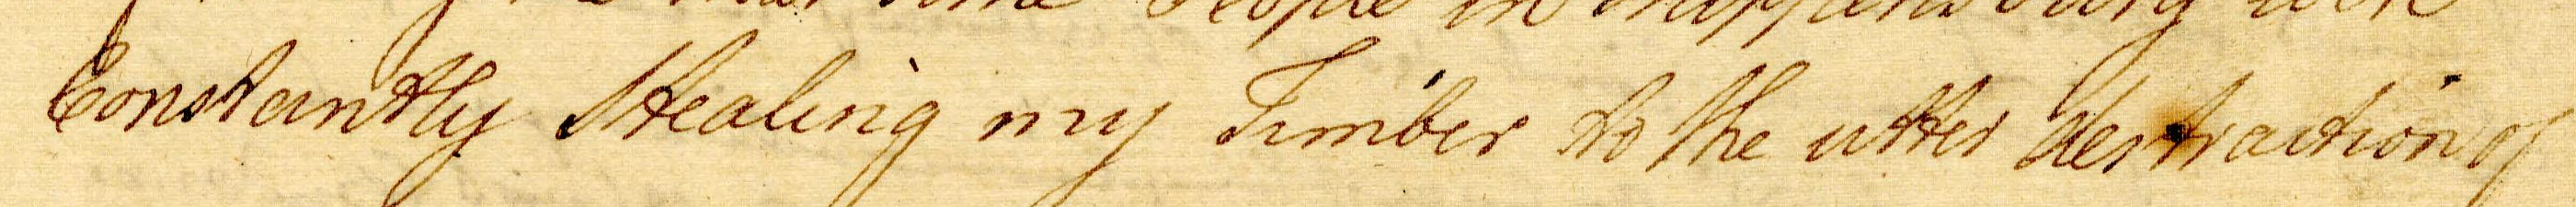Constantly Stealing my Timber to the utter destraction of
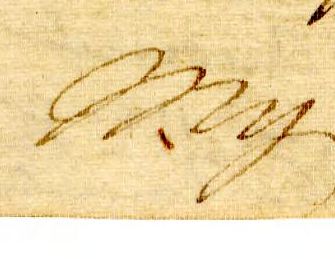My
